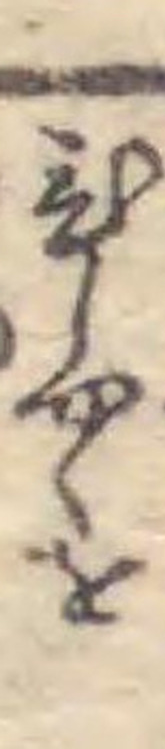ひしやくを
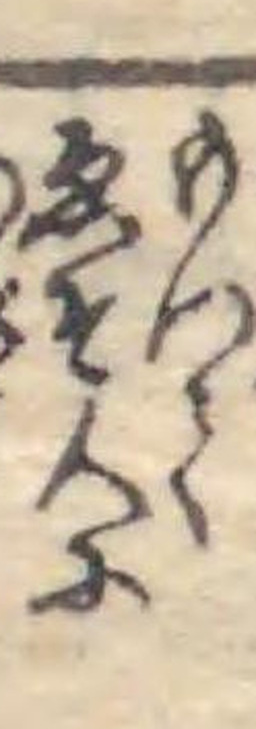ゑそ人に
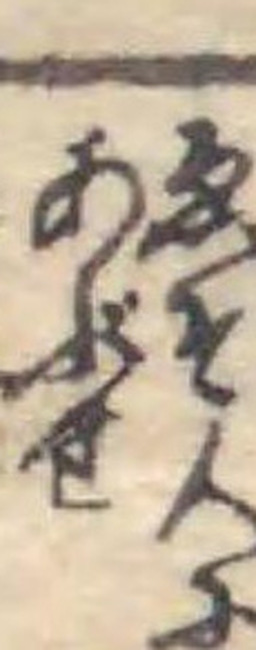あぶせ
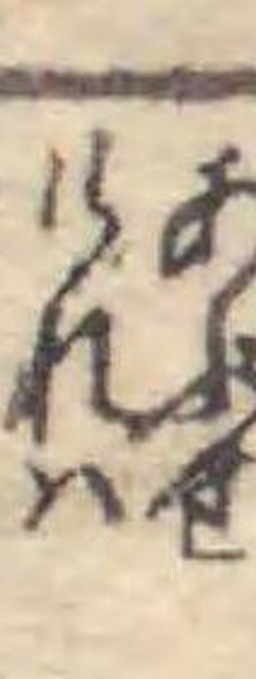けれは
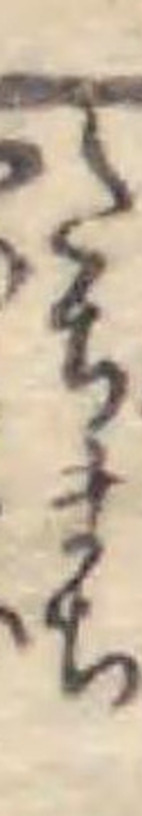たちまち
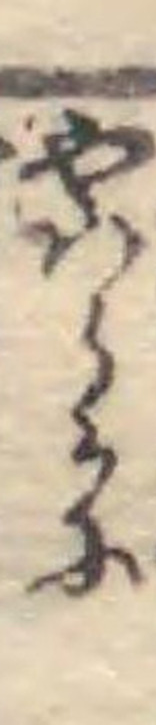やはらかに
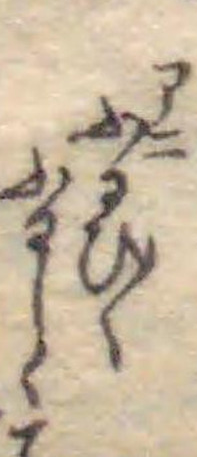ふるひ〳〵
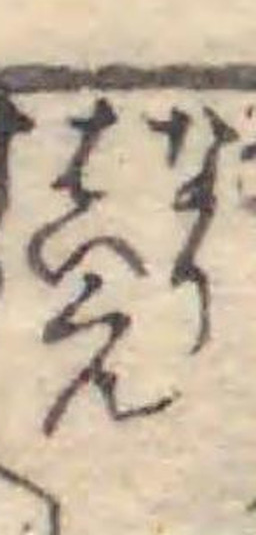はいくん
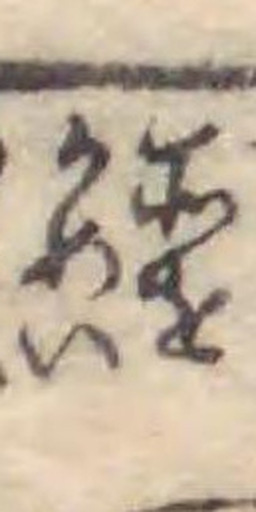かめい
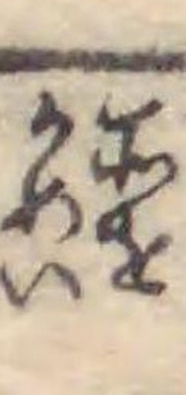かめい
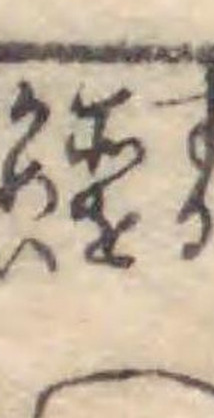かめい
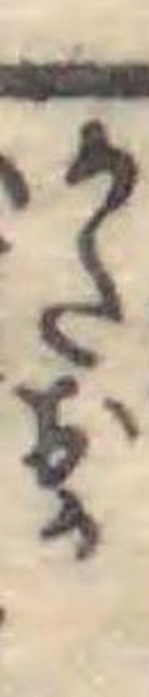かたおか
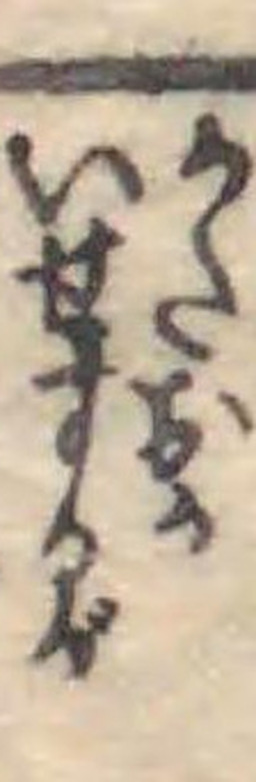いせするが
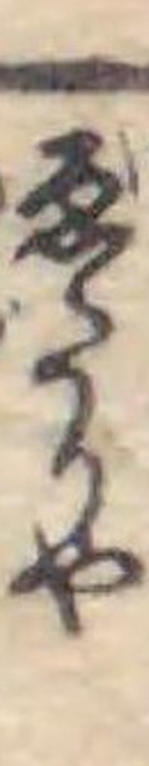ゑたりや
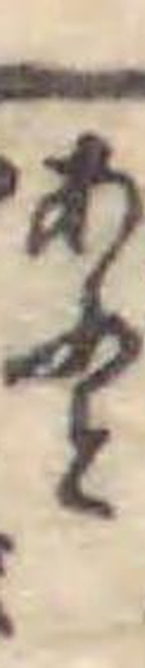あふと
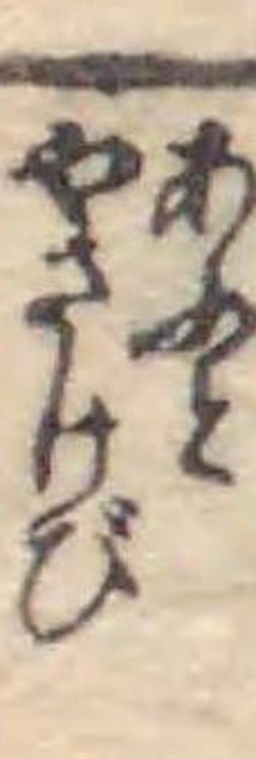やさけび
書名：悦贔負蝦夷押領 : 3巻
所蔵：国立国会図書館 National Diet Library, JAPAN
